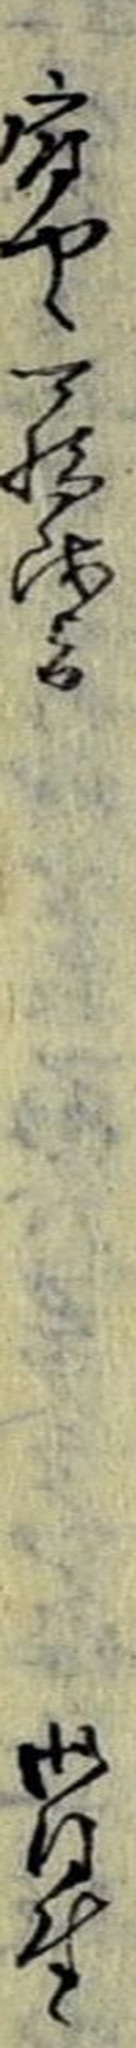府中へ可指越旨御目付
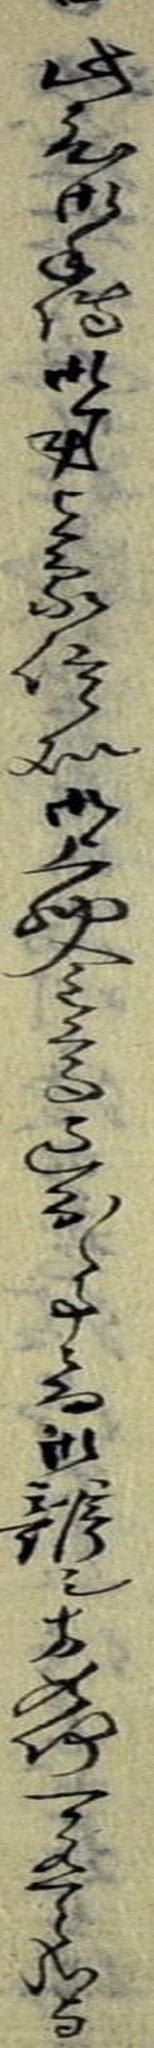○此度御手伝御用被蒙仰候処御上納金高過分之事に而御弁し方如何可有之候哉と
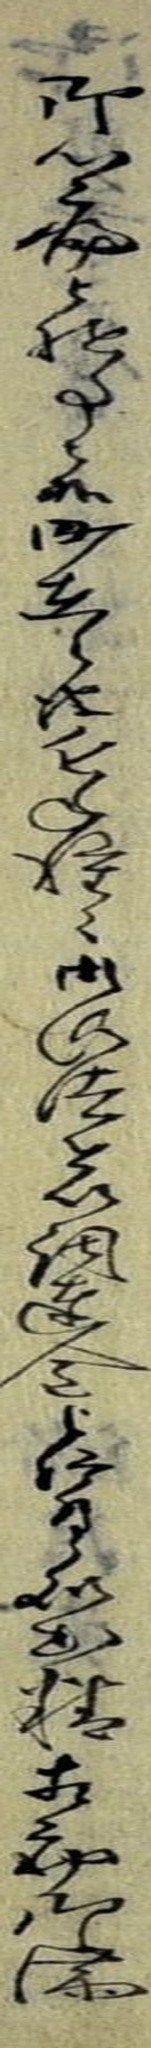御心痛被遊事に候町在之儀近年種々御趣法を以調達金被仰付候処出精相勤御満
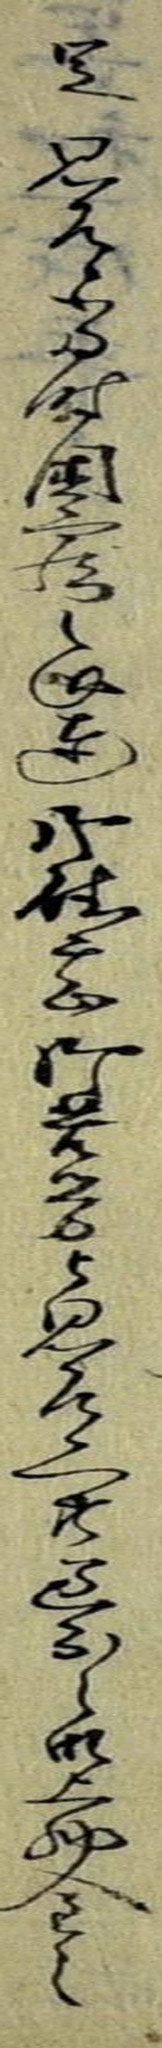足思召当時困窮之趣達御聴甚御苦労被思召候へ共過分之御上納金之
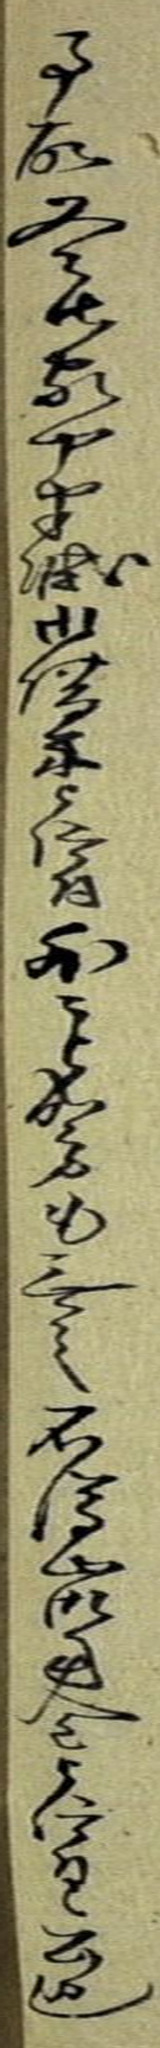事故又々御家中半減御借米被仰付外に被成方も無之不得止御用金被仰付候公辺
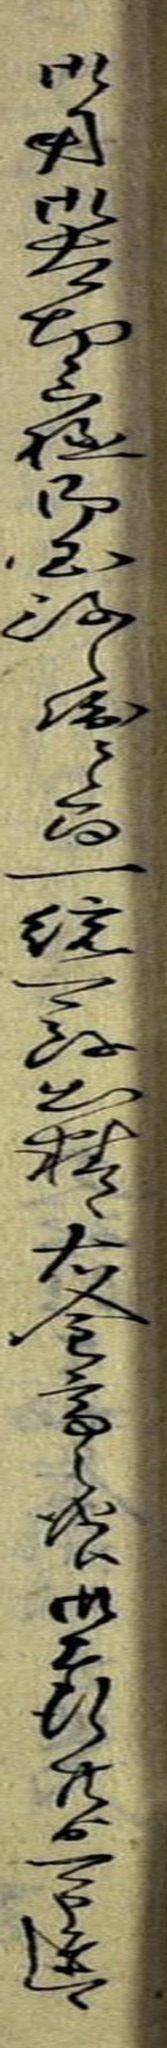御用御太切至極御国役之儀に候間一統可致出精候右金高之儀は御奉行共ゟ可申達候
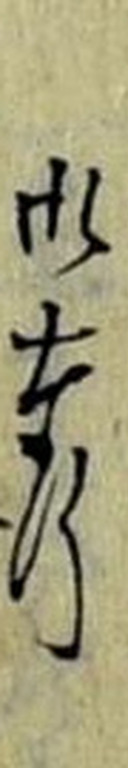御奉行
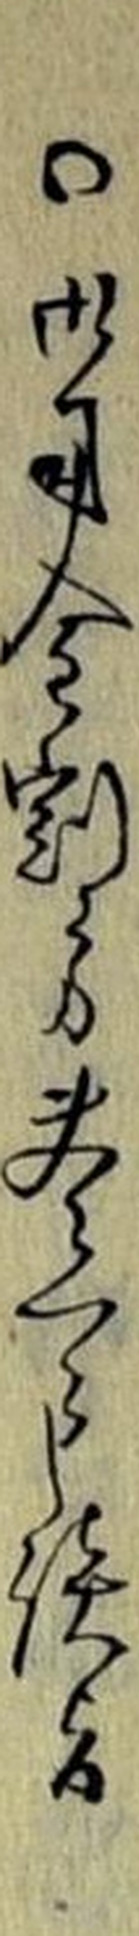○御用金割方夫々可被申談旨
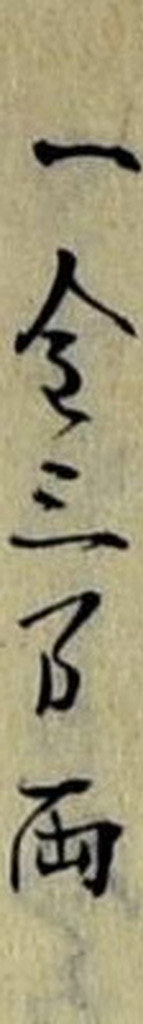一金三万両

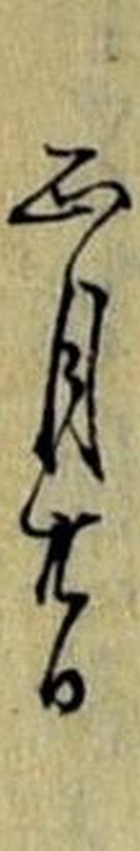正月廿日
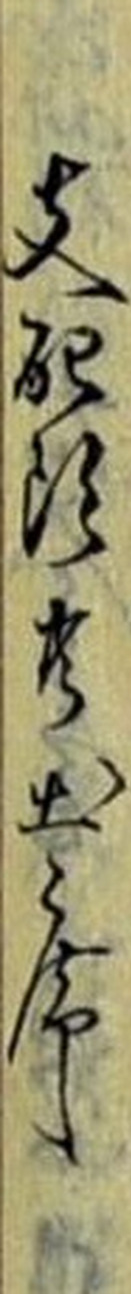支配頭共出席
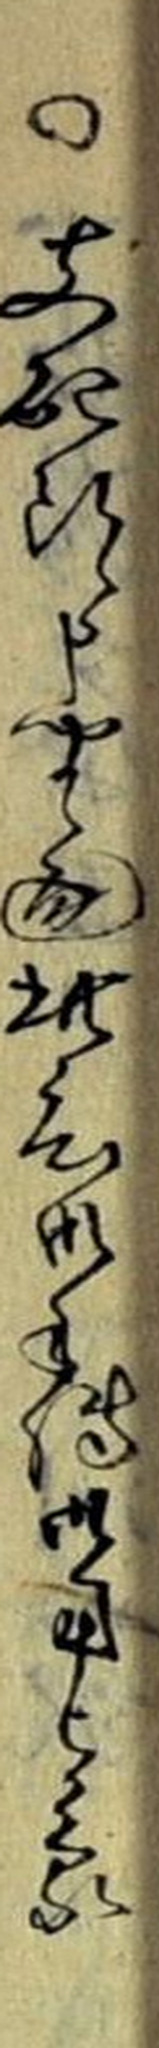○支配頭へ申聞候通此度御手伝御用被蒙
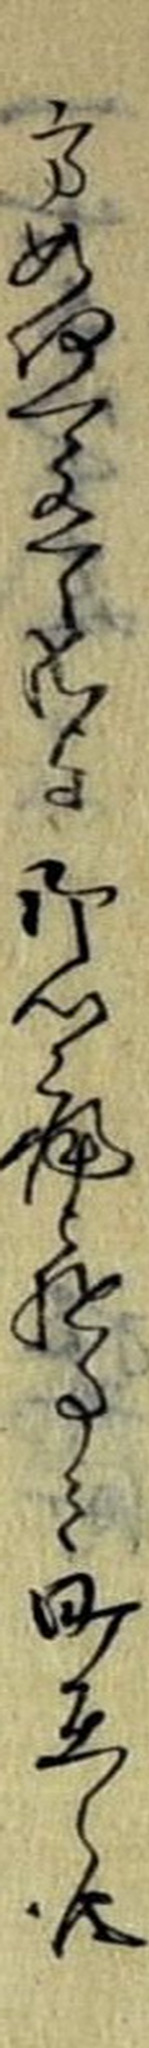方如何可有之哉と御心痛被遊事に候町在之儀
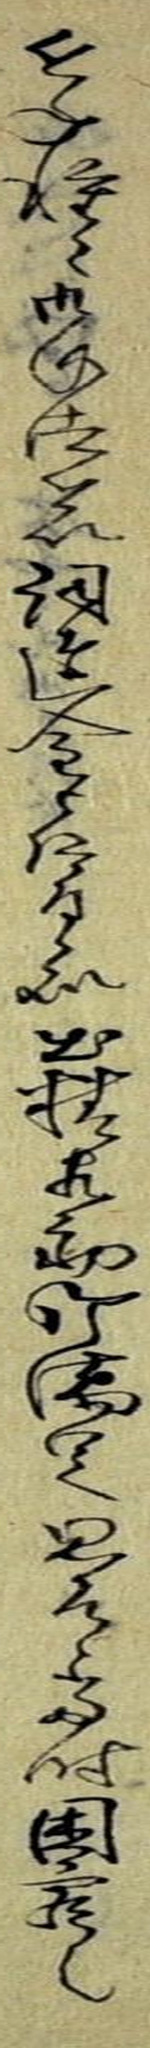近年種々御趣法を以調達金被仰付候処出精相勤御満足思召当時困窮之
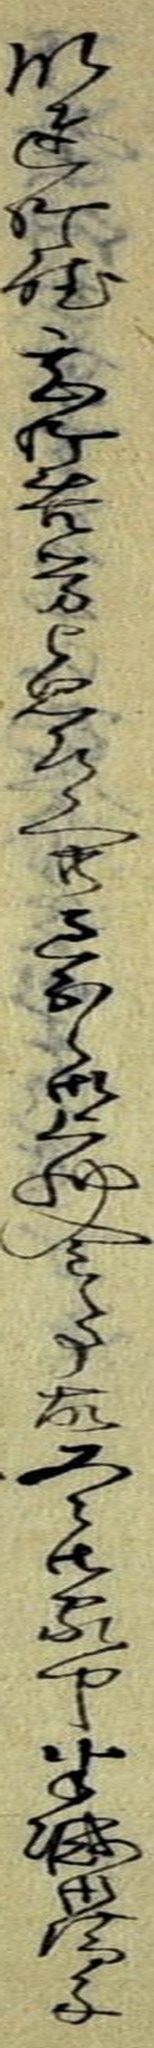段達御聴甚御苦労被思召候へ共過分之御上納金之事故又々御家中半減御借米
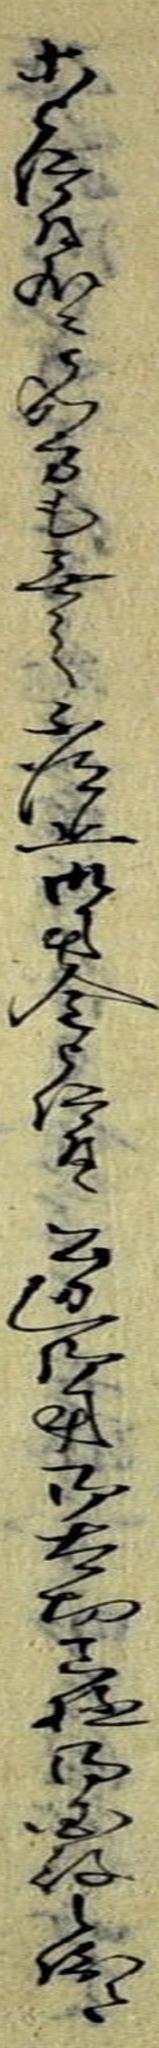等被仰付外に被成方も無之不得止御用金被仰付候公辺御用御太切至極御国役之儀に候
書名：命令之部 四
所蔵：福井県文書館 Fukui Prefectural Archives
